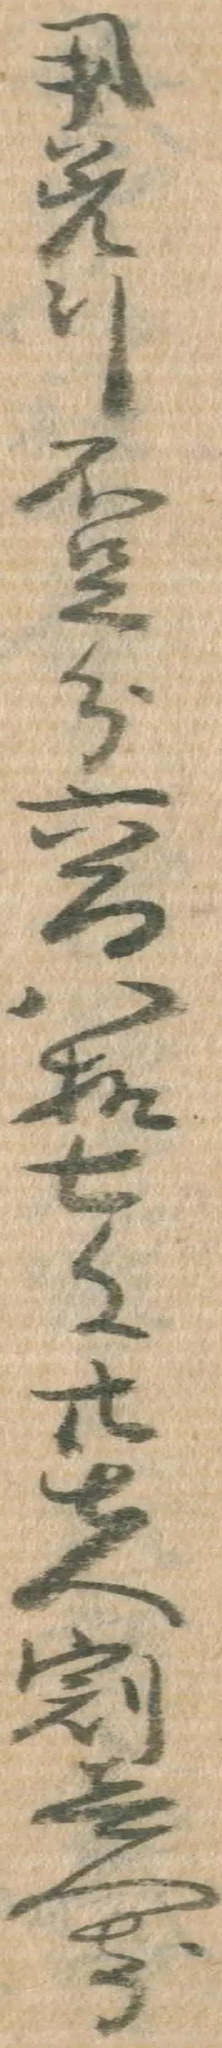用差引、不足分六百八拾七匁、廿七人割、壱人前
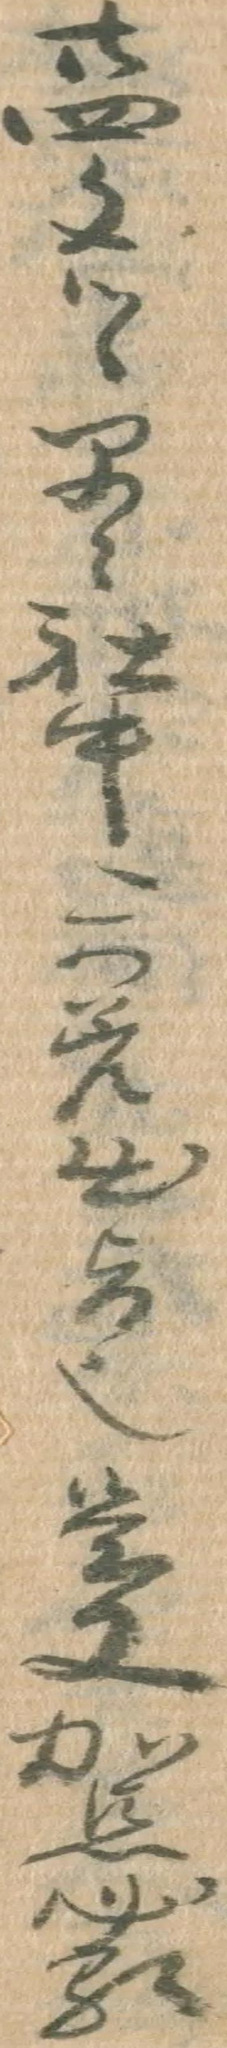廿四文ツヽ、早々社中へ可差出旨也、是又加点、必顕
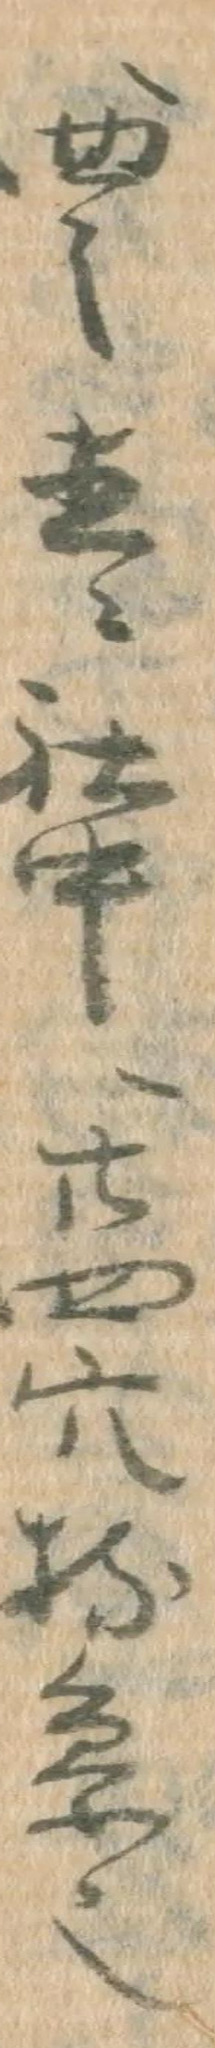へ回之、直ニ社中へ廿四文持参也、
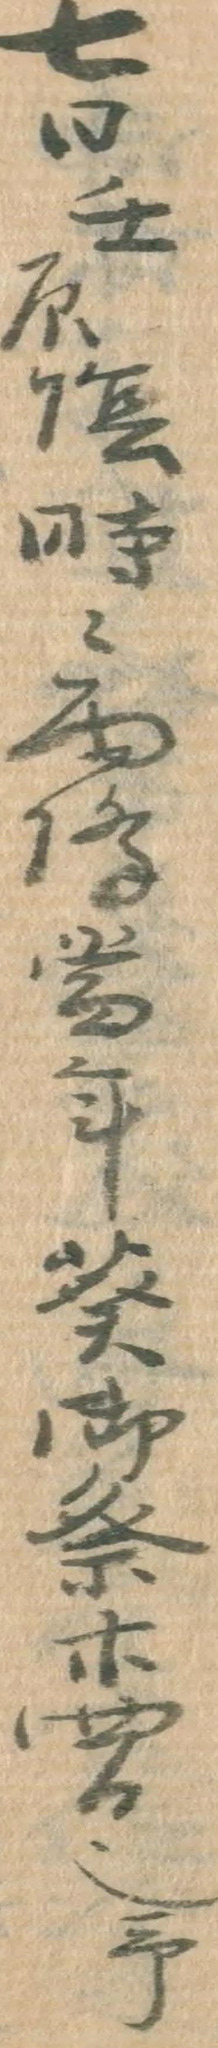七日壬辰陰時々雨降、當年葵御祭廿四日也、予
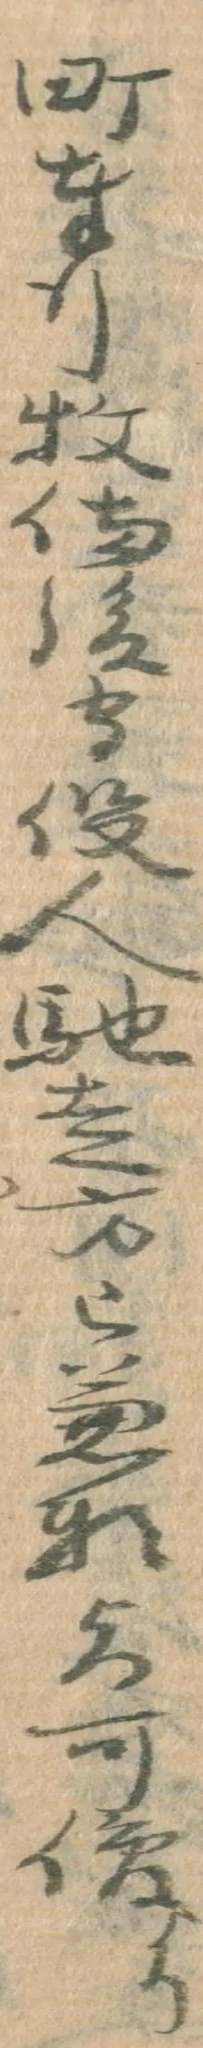町奉行牧備後守役人馳走方被兼頼旨、可俊より

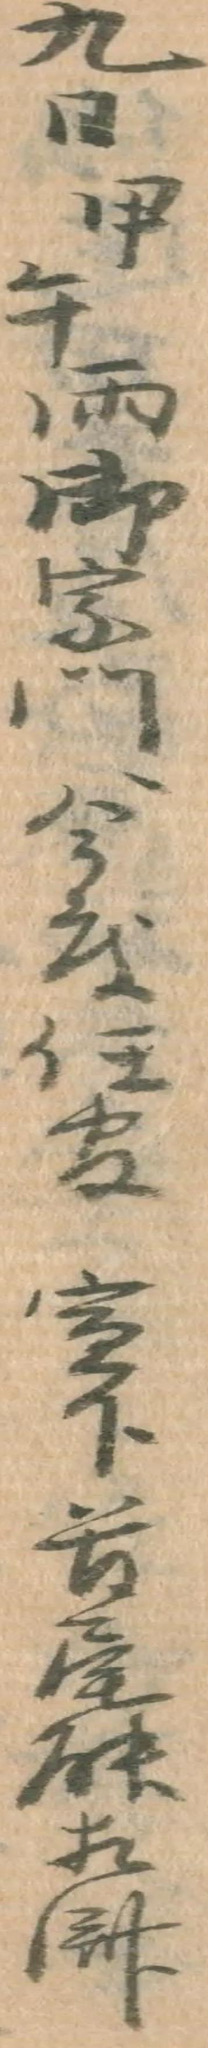九日甲午雨、御家門へ、今度任官宣下首尾能相済
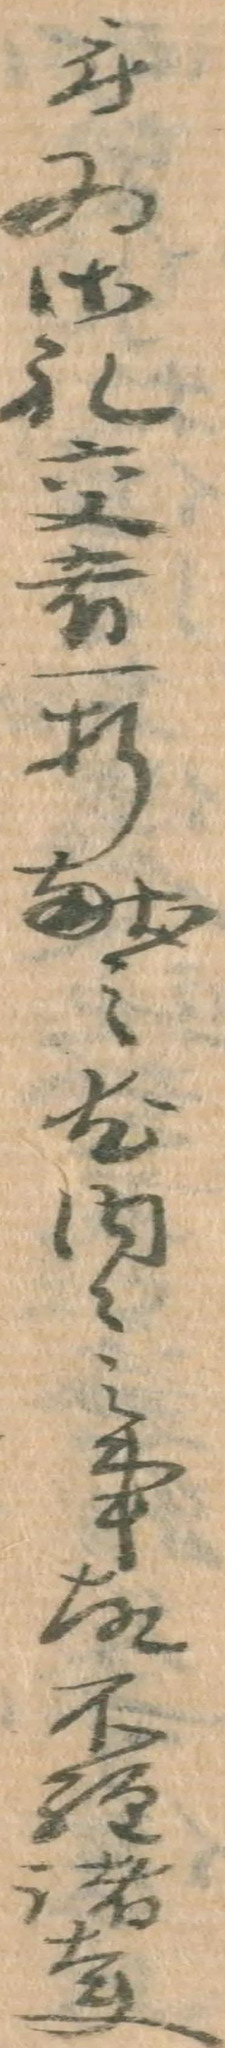ニ付、為御礼交肴一折献之、尤内々之事故、不程諸大夫
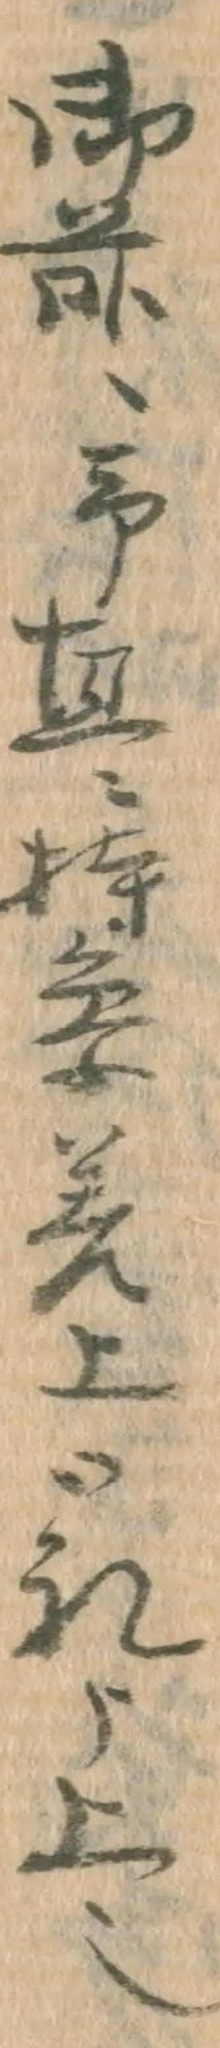御前へ予直ニ持参差上御礼申上也、
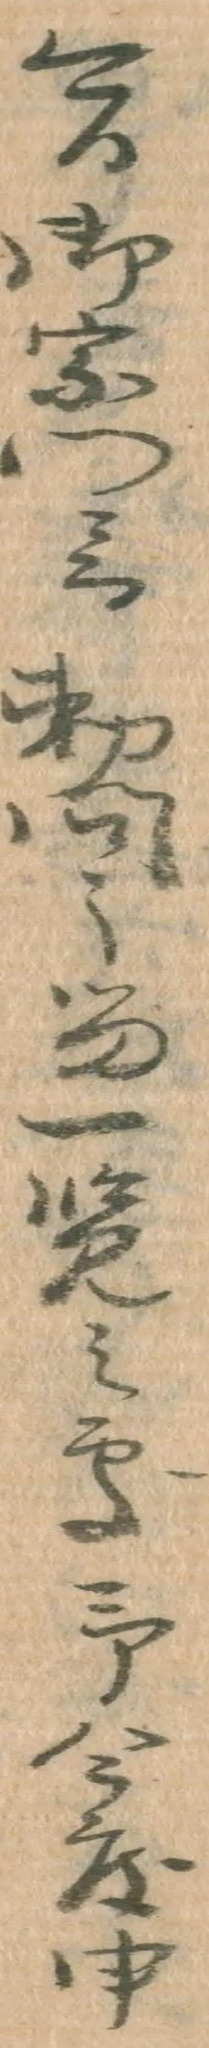今日御家門ニ而勅問之留一覧之處、予今度申
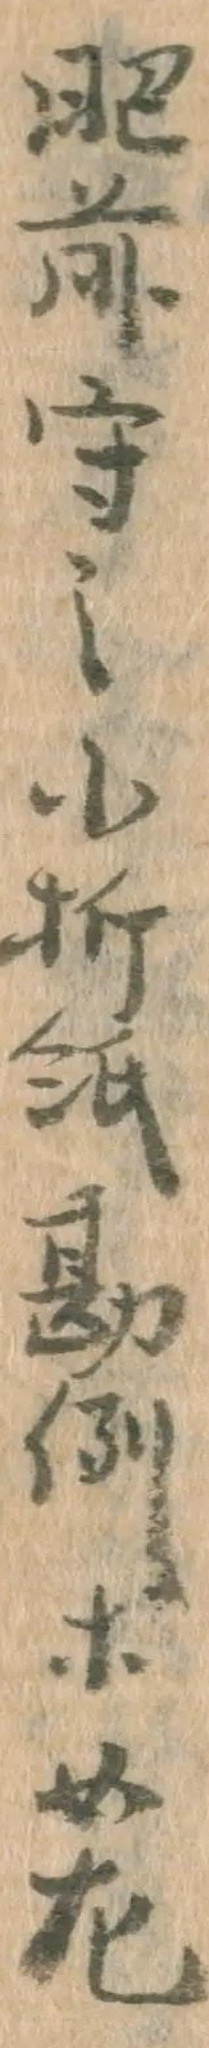肥前守之小折紙勘例等如左、
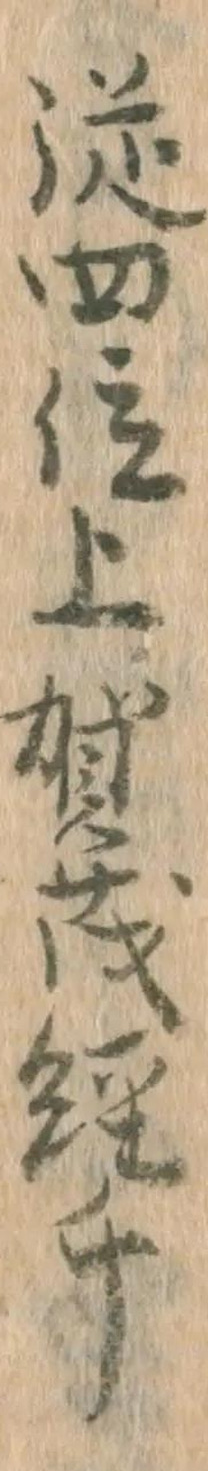従四位上賀茂経千
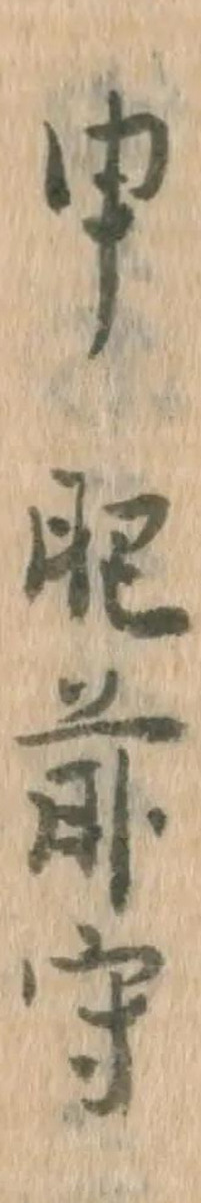申肥前守
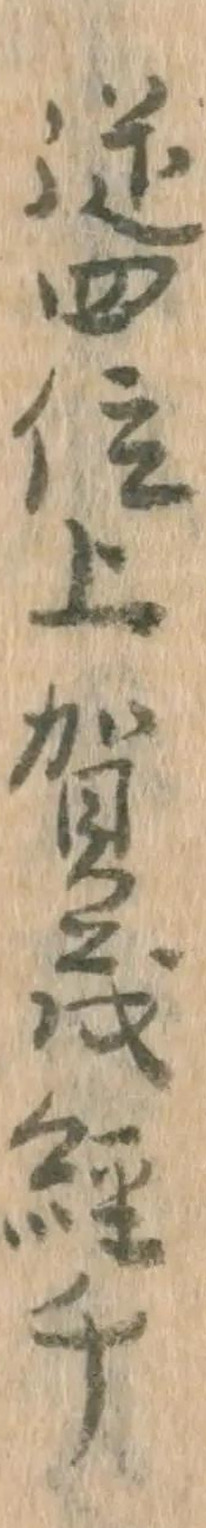従四位上賀茂経千
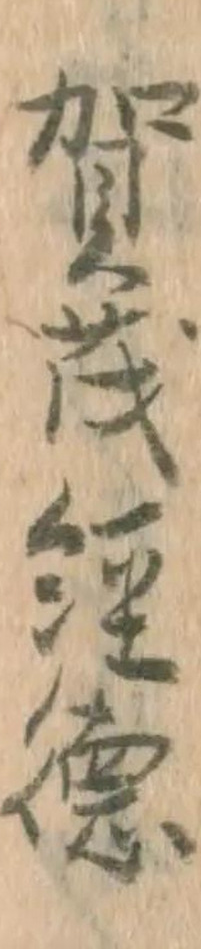実茂経徳
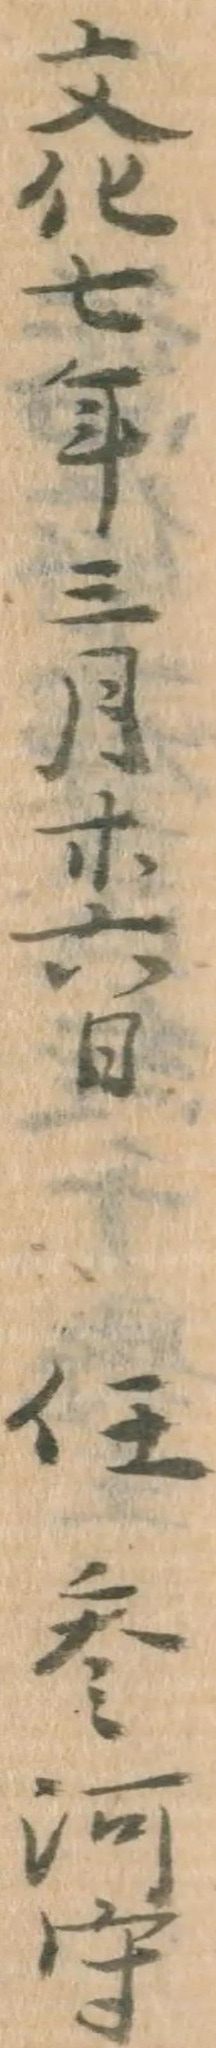文化七年三月廿六日任参河守
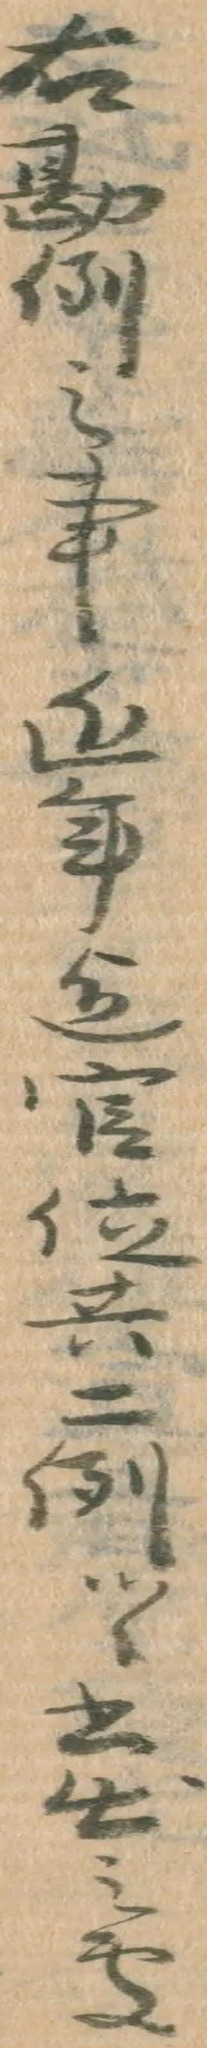右勘例之事、近年迄官位共二例ツヽ書出之處、
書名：賀茂社記録. 第63冊
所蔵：国立国会図書館 National Diet Library, JAPAN
